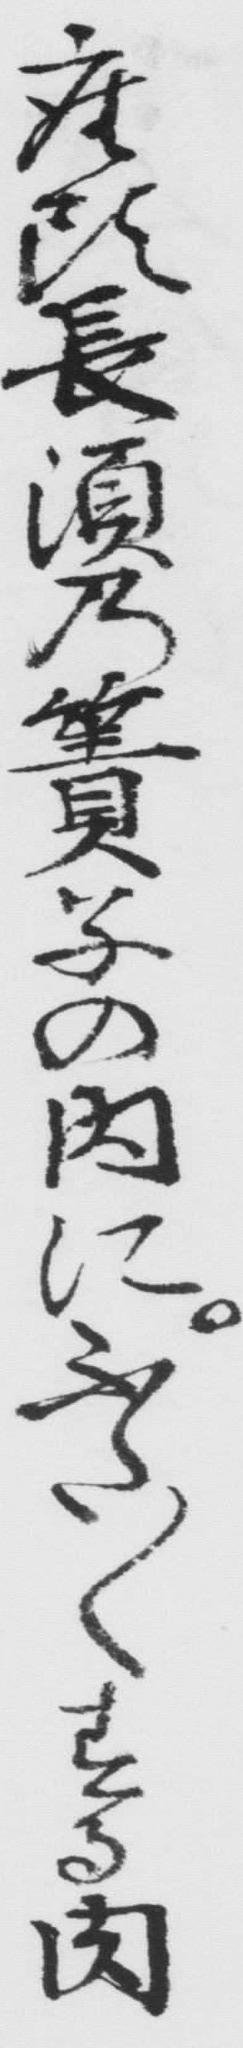ブタ座頭長須の簀子の内に。ふたふたする肉
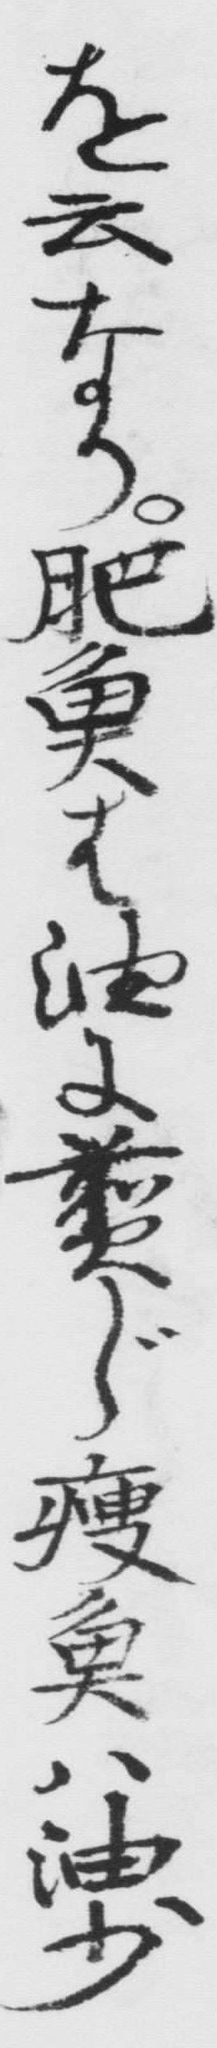を云なり。肥魚は油に煎じ痩魚は油少

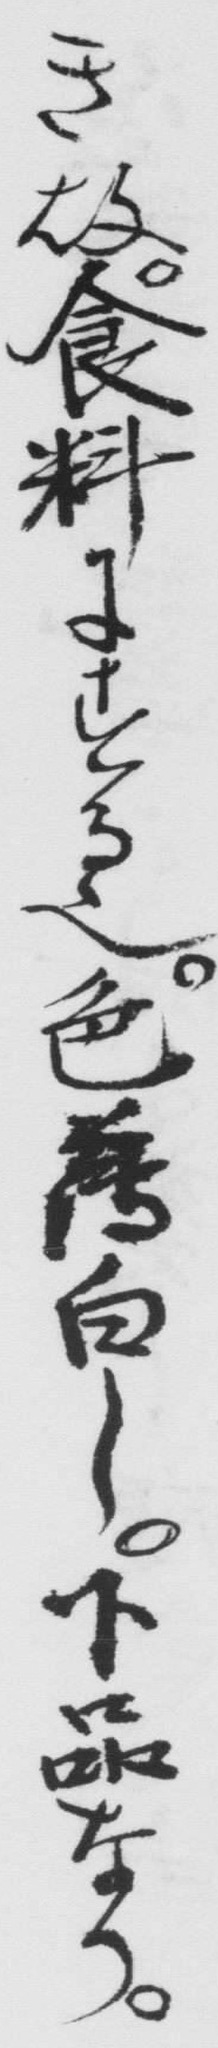き故。食料にする也。色薄白し。下品なり。
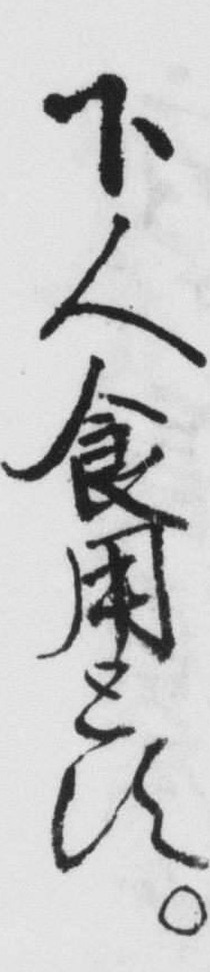下人食用とす。
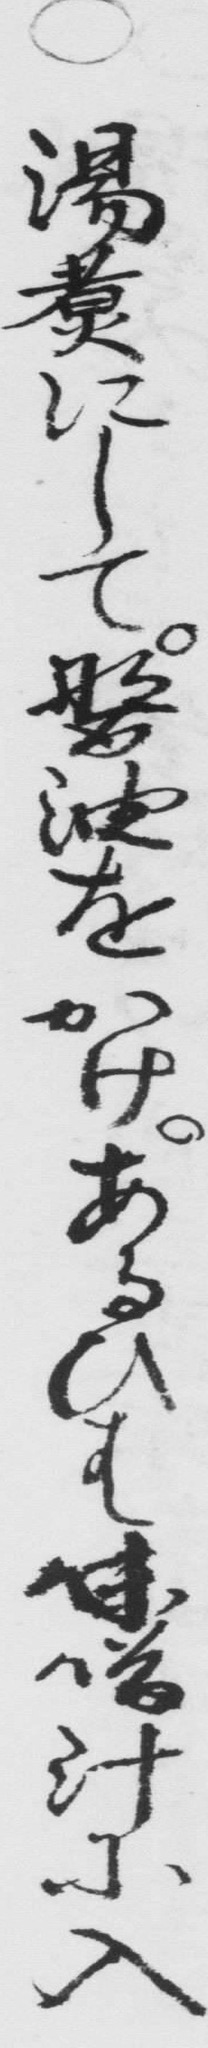○湯煮にして。醤油をかけ。あるひは味噌汁に入
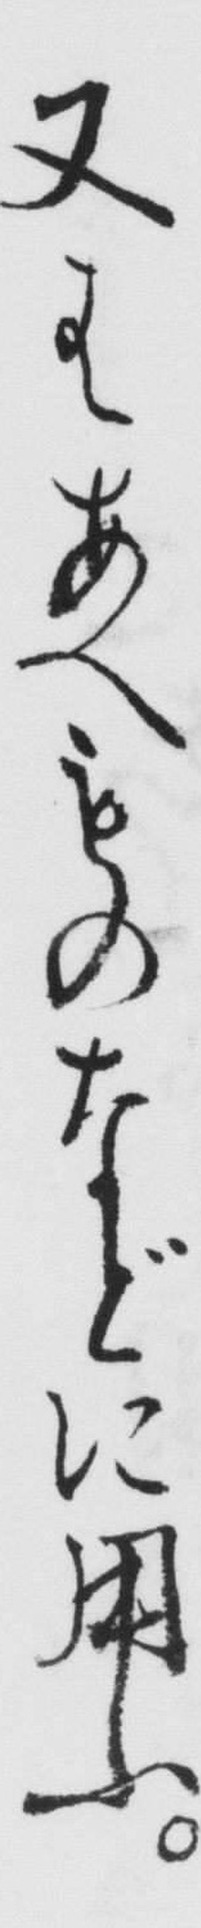又はあへものなどに用ふ。
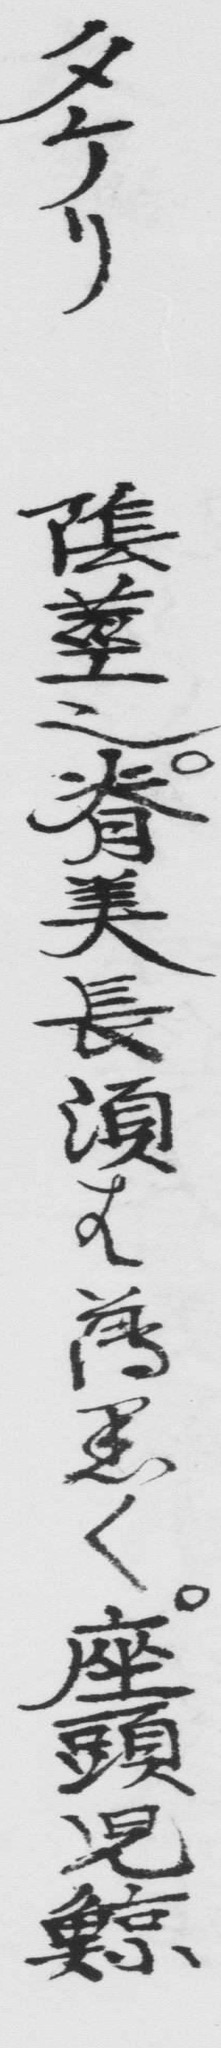タケリ陰茎也。背美長須は薄黒く。座頭児鯨
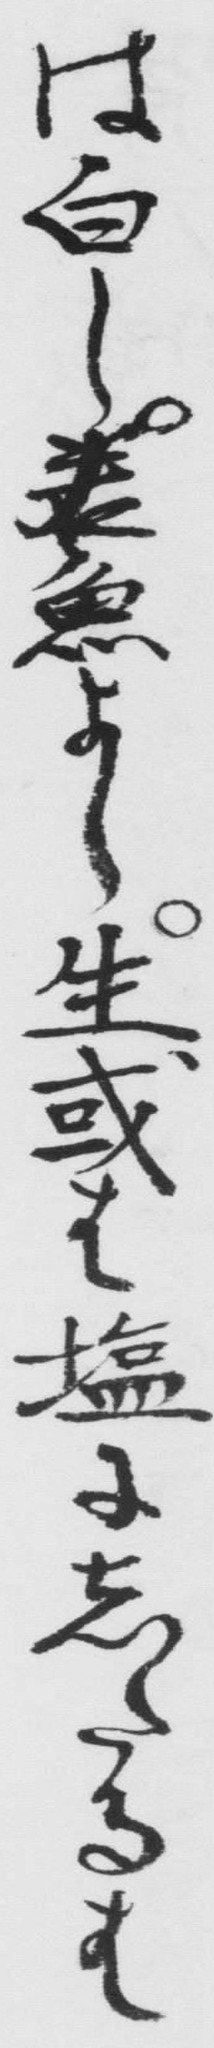は白し。若魚よし。生或は塩にしたるは
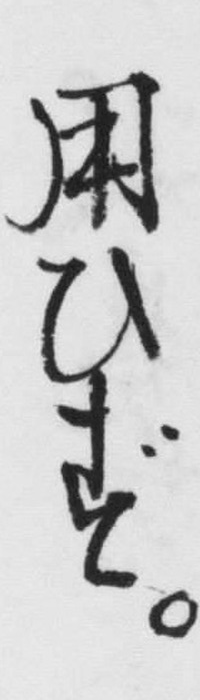用ひず。
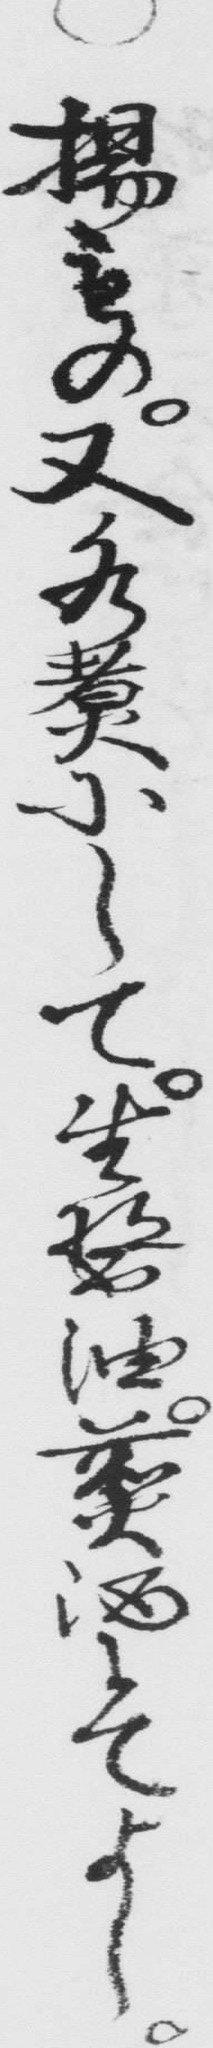○揚もの。又水煮にして。生醤油。煎酒にてよし。
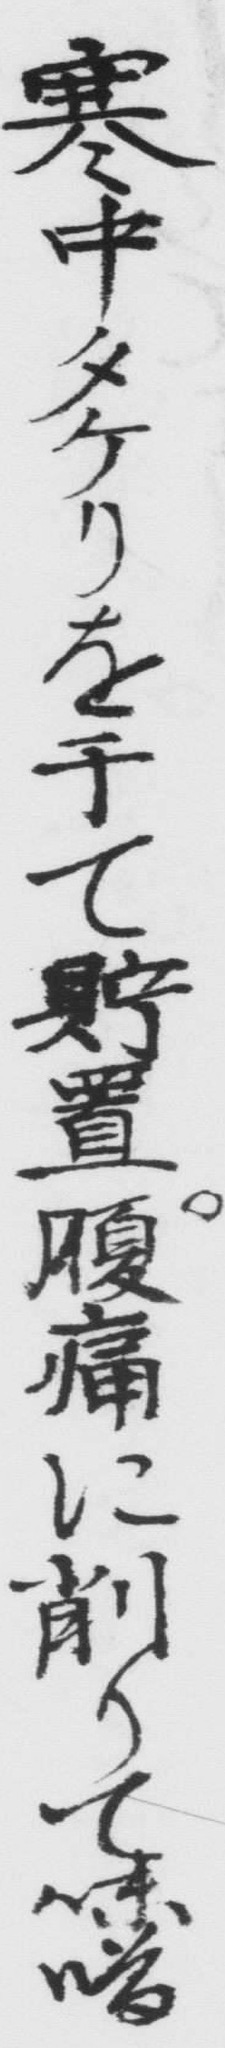寒中タケリを干て貯置。腹痛に削りて味噌
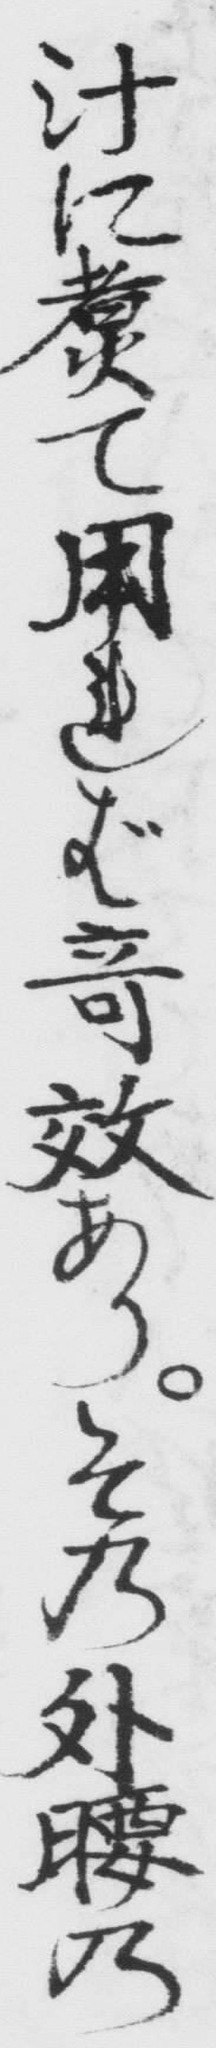汁に煮て用れば奇効あり。その外腰の
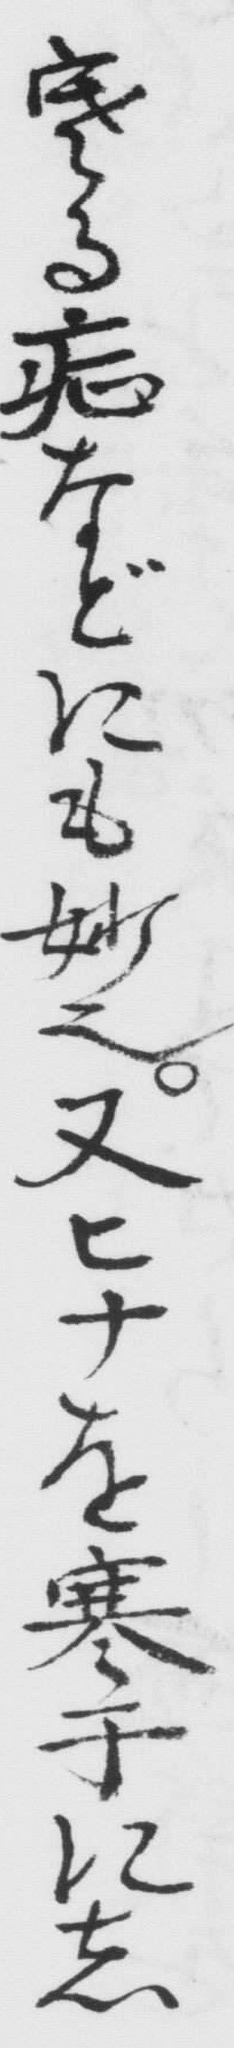寒る症などにも妙也。又ヒナを寒干にし
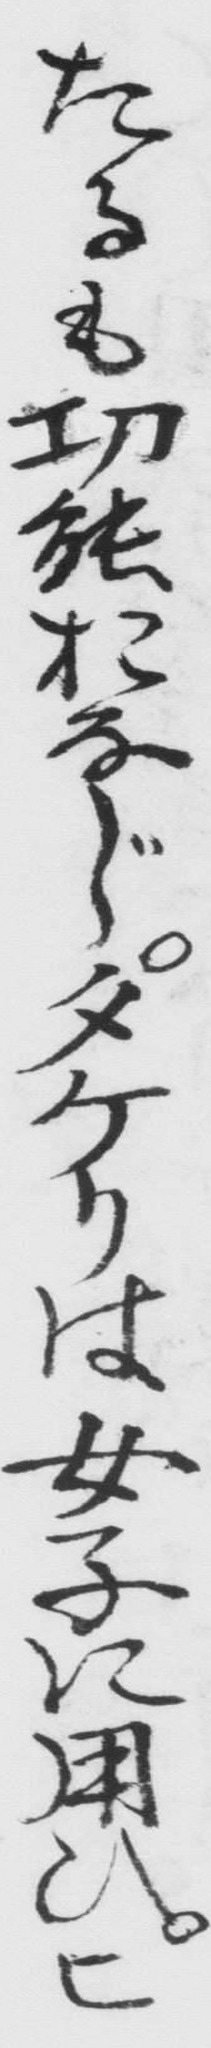たるも効能おなじ。タケリは女子に用ひ。ヒ
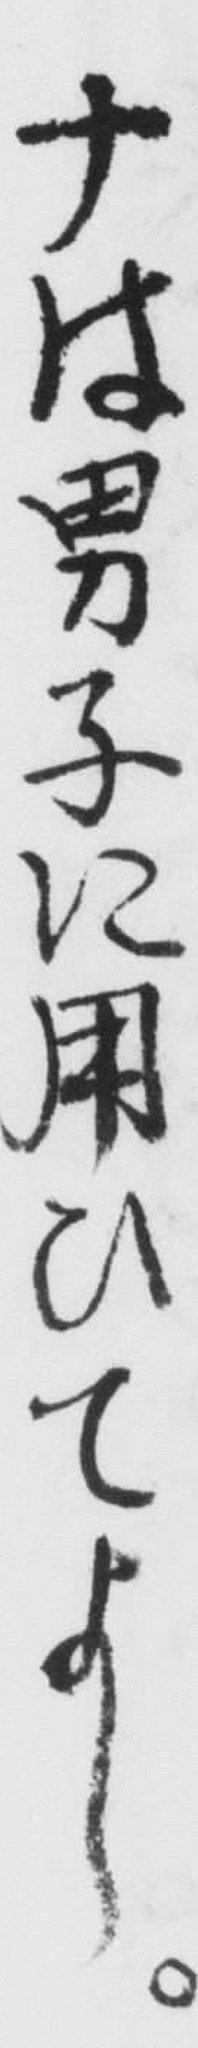ナは男子に用ひてよし。
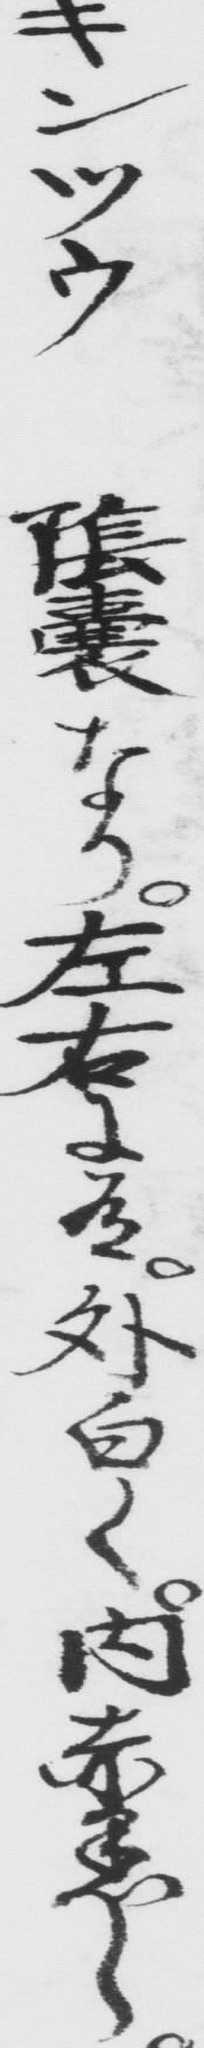キンツウ陰嚢なり。左右に有。外白く。内赤黒し。
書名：鯨肉調味方
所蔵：大阪府立大学学術情報センター 国文学研究資料館
